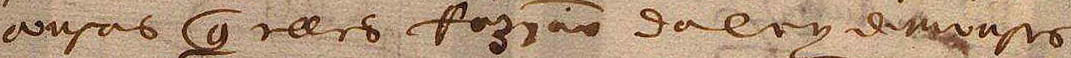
cousas q̄ elles fazyão da ley de mouses
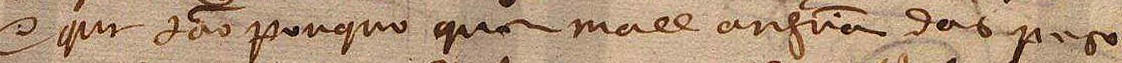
e que tão pouquo quer mall a nhūa das peso
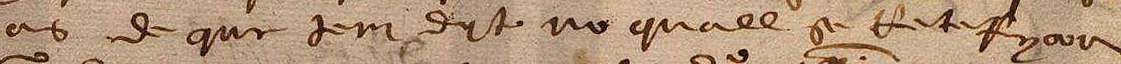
as de que tem dyto no quall se Retefycou
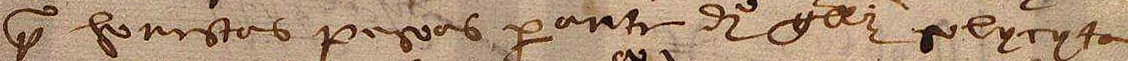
p̄o honestas pesoas ꝑante djo gl̄lz solyçyta
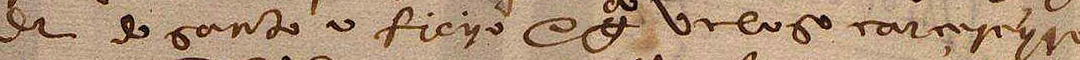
dor do santo oficyo e gco veloso carçereyro
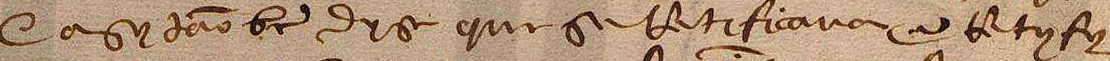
e asy tãobē dyse que se Retificaua e Retyfy
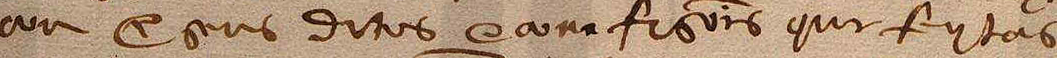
cou ē seus ditos e comfisões que feytas
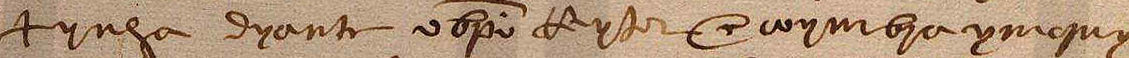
tynha dyante o b̄po Reytor ē coymbra ymquy
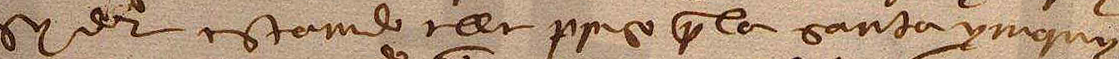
sydor estamdo elle preso p̄la santa ymquy
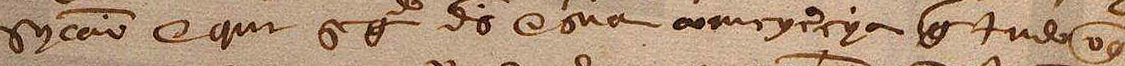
sycão e que segdo d̄s e sua comcyēçya q̄ tudo o q̄
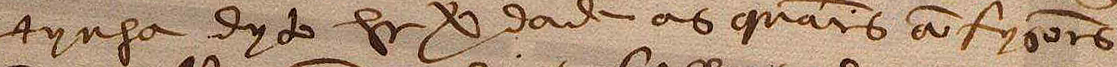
tynha dyto he ꝟdade as quāes cōfysões
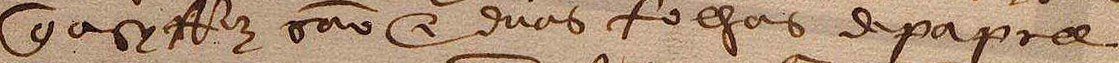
q̄ asy ffez são ē duas folhas de papell
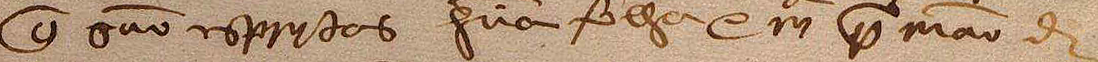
q̄ são esprytas h̄ua folha e ma p̄o mão de
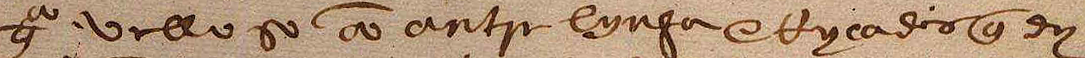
gco velloso cō antrelynha e Riscados q̄ dy
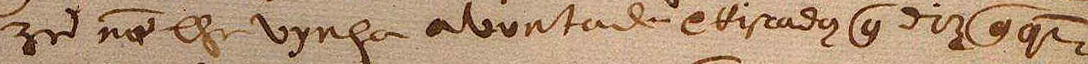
zē molher vynha a vontade e Riscadꝯ q̄ diz q̄ qr̄
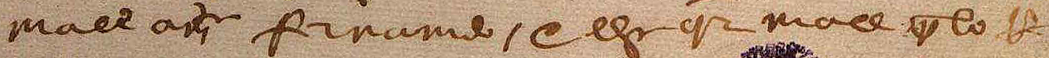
mall a mte fernamdo / e lhe q̄r mall p̄lo Re
